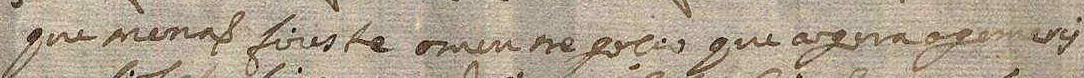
que me naõ fizeste o meu negocio que agora agencerej
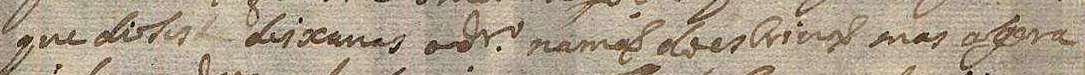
que diseste deixanos o dr.o na maõ do esCriuaõ mas agora
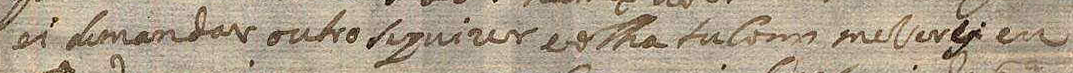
ei de mandar outro se quizer e olha tu Como me verej eu
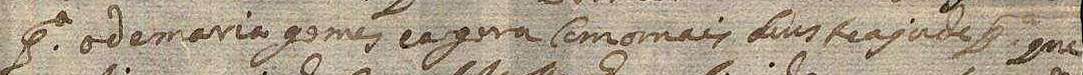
p.a o de maria gomes e agora com o mais deus te ajude p.a que
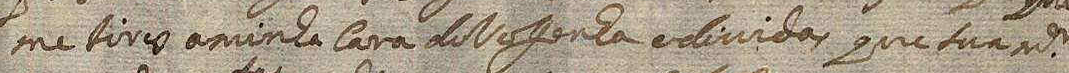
me tires a minha Cara de Vergonha e diuidas que sua m.er
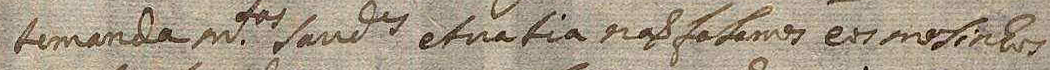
demanda m.tas saudes e tua tia naõ falamos e os mesinhos
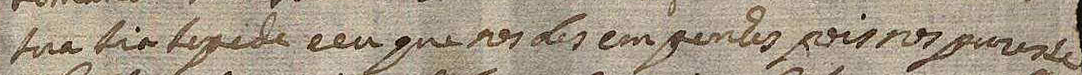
tua tia se pede e eu que nos desempenhes pois nos puzeste
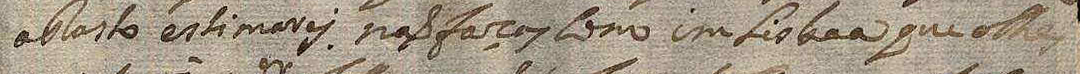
a Rasto estimarej naõ faças como em Lisboa que olhes
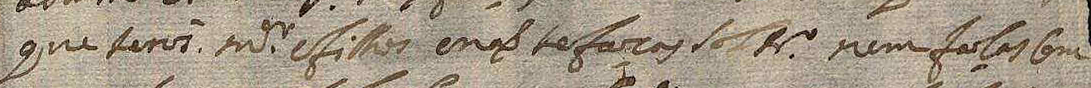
que tens̄. m.er e filhos e naõ te faças soltr.o nem faÇas Com
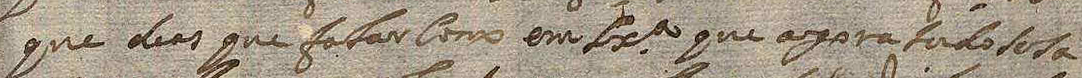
que deas que falar Como em Lx.a que agora tudo se sa
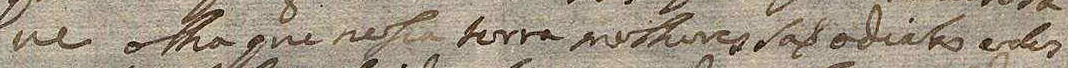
ue olha que nessa terra molheres saõ o diabo e des
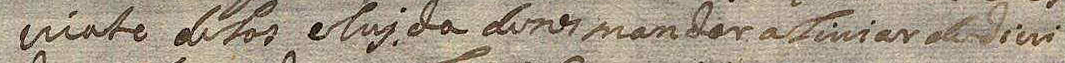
uiate delas, e Cujda de nos mandar aliuiar de diui
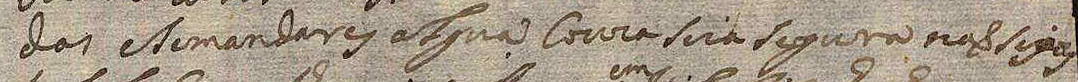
das, e se mandares alguā Couza seia segura naõ sejas
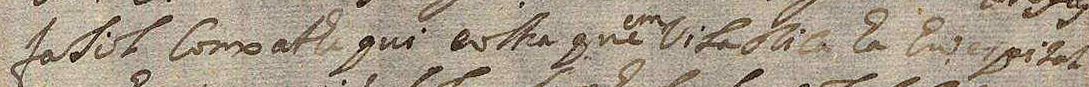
fasil Como athe qui e olha que em Vila Rica ha hū espital
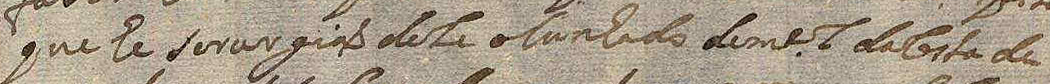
que he serurgiaõ deLe o Cunhado de m.el da Costa de
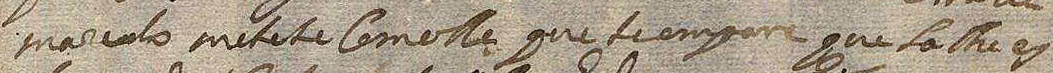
macedo metete Com elle que te empare que La lhe ej
